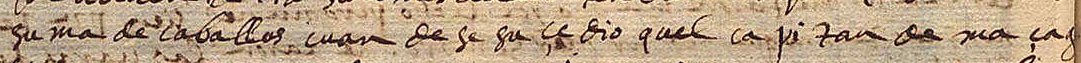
suma de caballos cuande se sucedio qual capitan de maçag
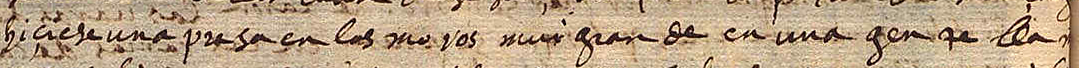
hiciese una presa en los moros mui grande en una gente lla
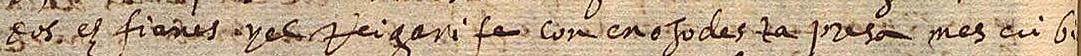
dos ezfianes y el Rei garife con enoJo desta presa mescrib
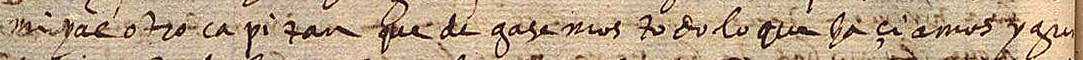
mi y al otro capitan que degasemos todo lo que haciamos y gu
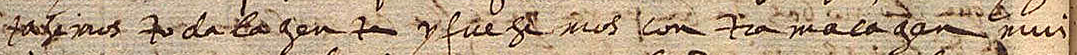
tasemos toda la gente y fuesemos contra maçagan mui
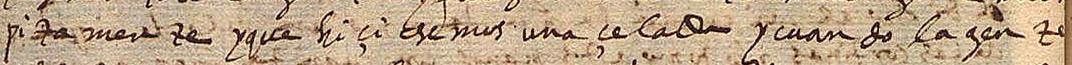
pitamente y que hiciesemos una celada y cuando la gente
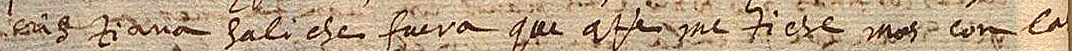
cristiana saliese fuera que aRemetiesemos con la
